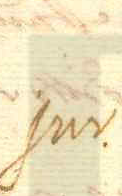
Jur.
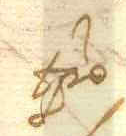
tp̄o
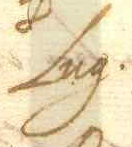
Lug.
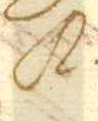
R.
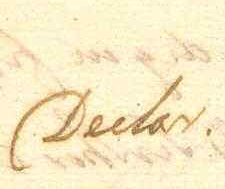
Declar.
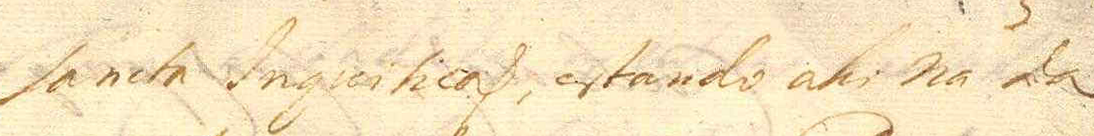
sancta Inquisiçaõ, estando ahi na da
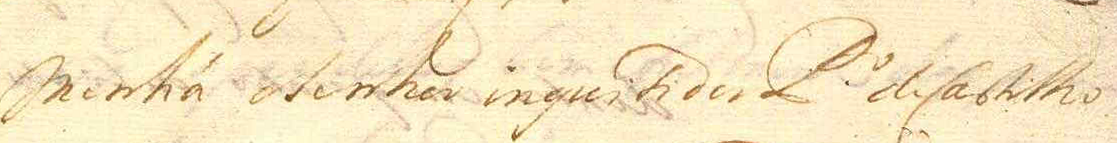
menhã o senhor inquisidor P.o de Castilho
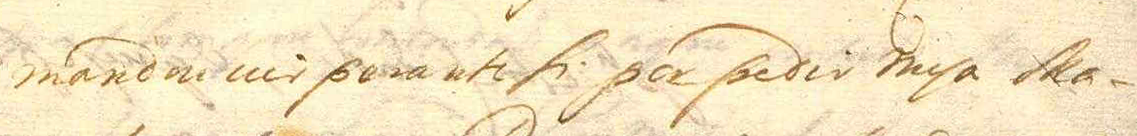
mandou uir perante si por pedir mesa Ma
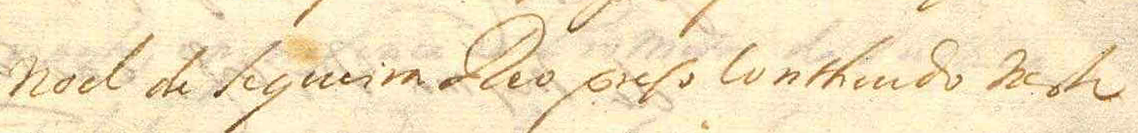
noel de Sequeira Reo preso contheudo neste
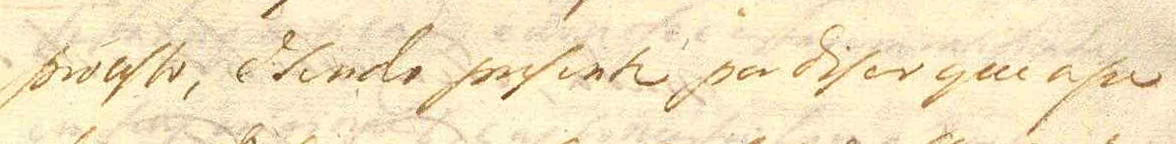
processo, e sendo presente por diser que a pe
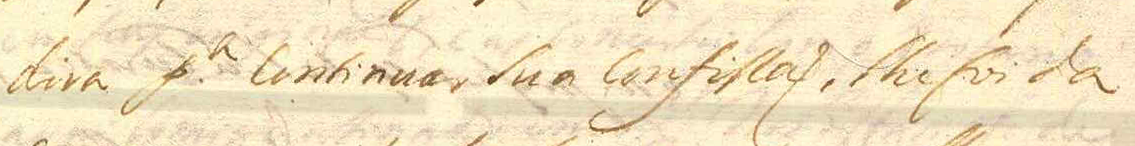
dira p.a continuar sua confissaõ, lhe foi da
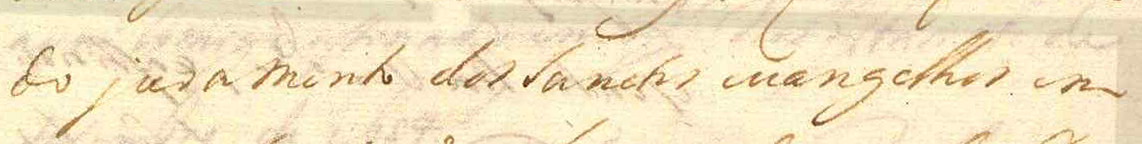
do juramento dos Sanctos euangelhos em
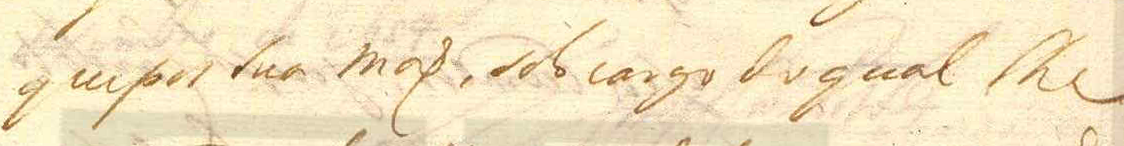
que pos sua maõ, sob cargo do qual lhe
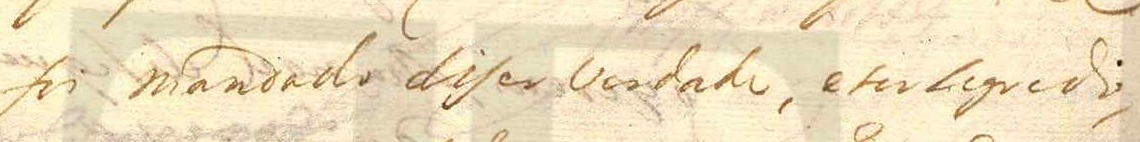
foi mandado diser verdade, e ter segredo,
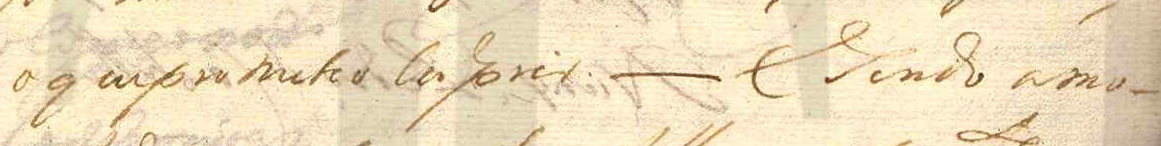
o que prometeo cūprir. ‒ E sendo amo
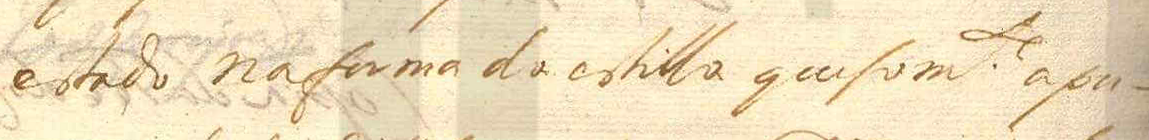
estado na forma do estillo que som.te a pu
